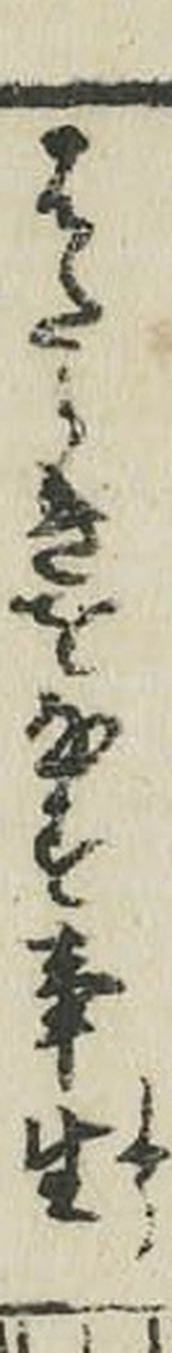はたらきをなす事生
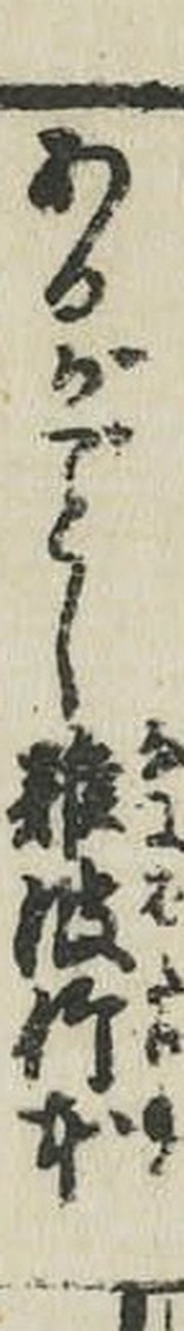あるがごとし難波竹本
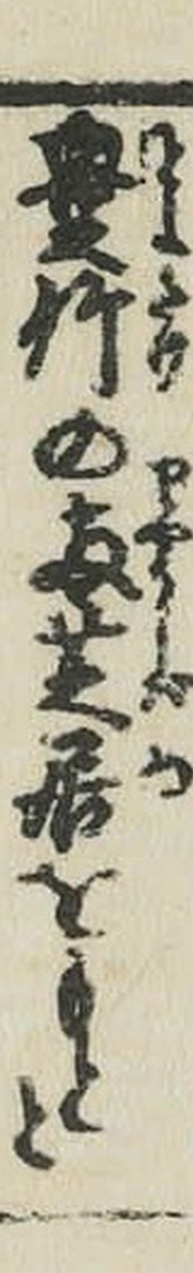豊竹の両芝居をもとと
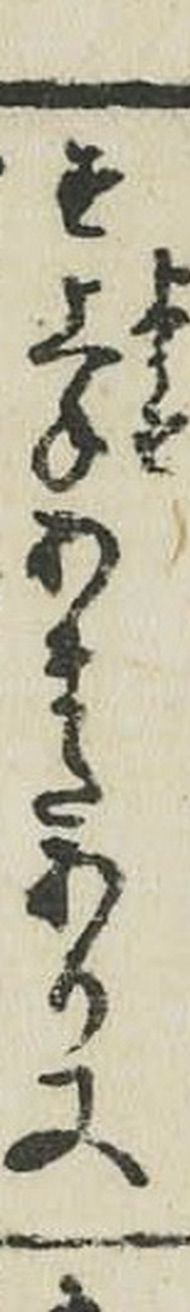す上手あまたあり又
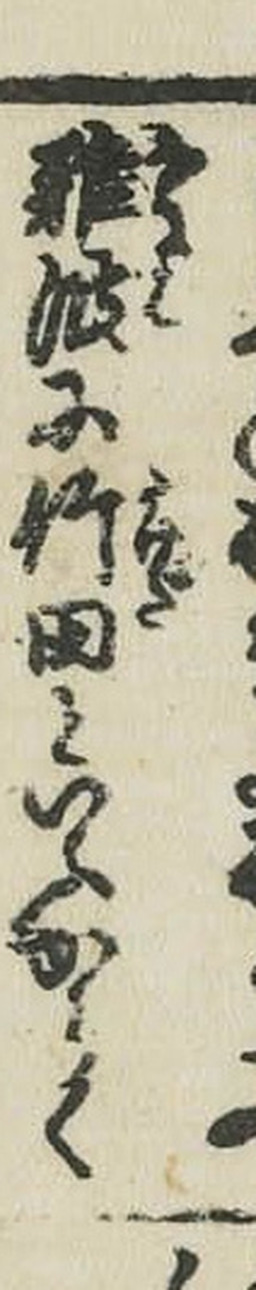難波に竹田といふからく
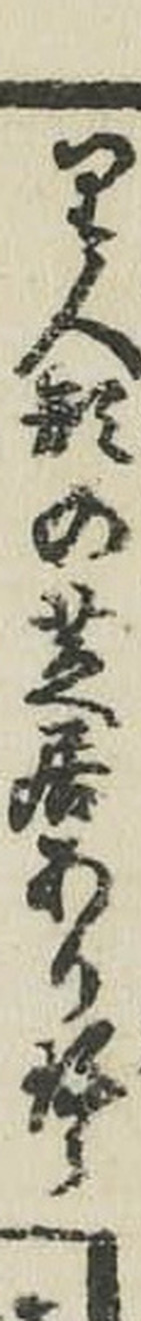り人形の芝居あり珍ら
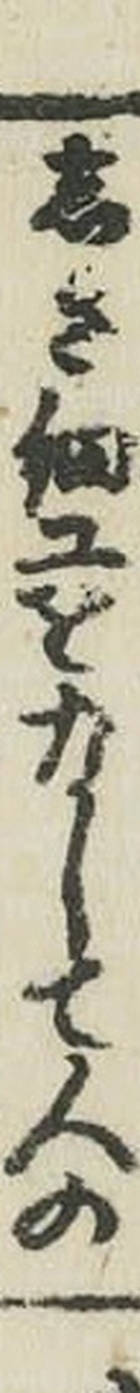しき細工をなして人の
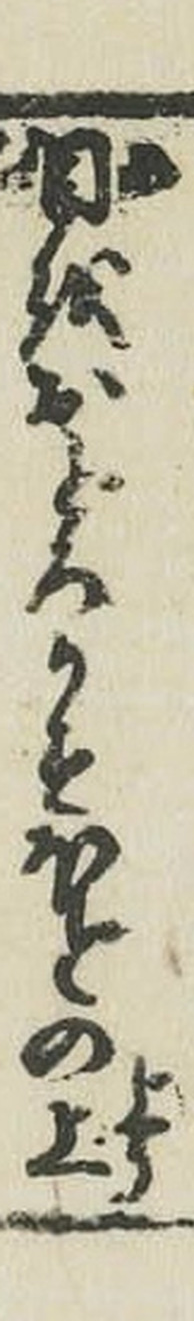目をおどろかすほどの上
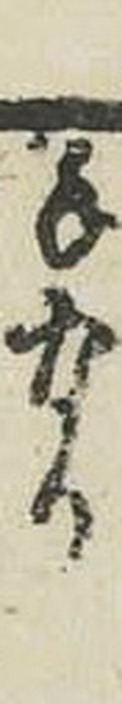手なり
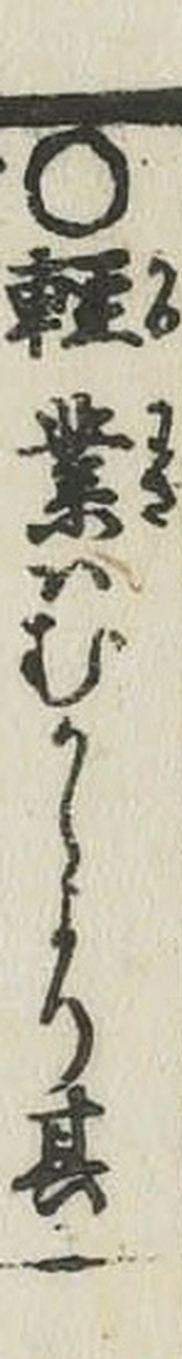○軽業はむかしより其
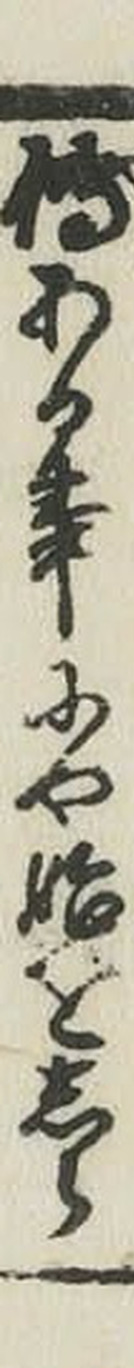伝ある事にや始をしら
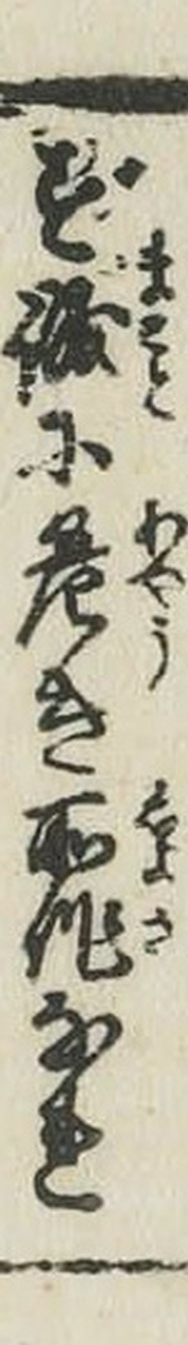ず誠に危き所作なれ
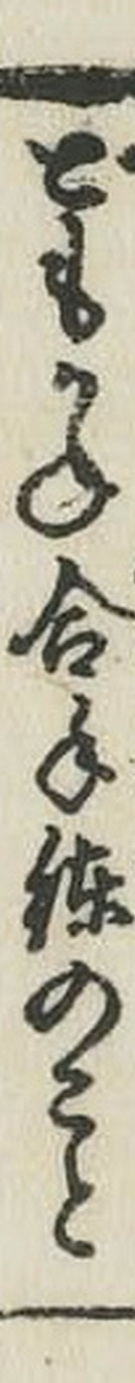どもかね合手練のこと
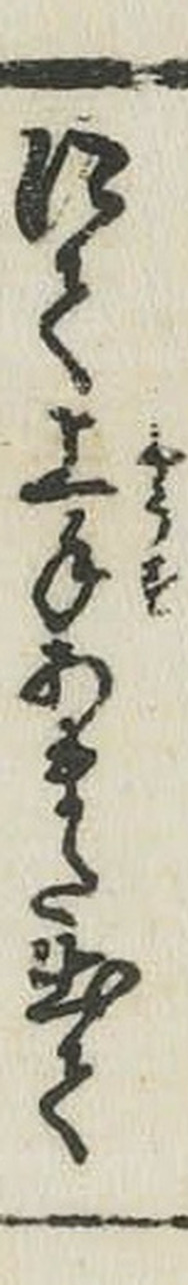にて上手あまた出て
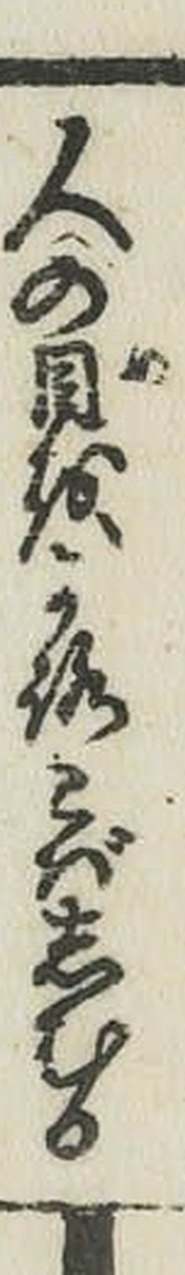人の目をよろこばしむる
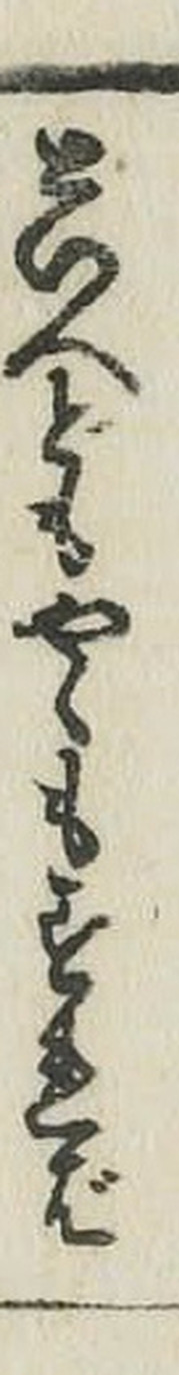といへどもやゝもすれば
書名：増補頭書訓蒙図彙大成 10巻 10:巻之21
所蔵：東京学芸大学教育コンテンツアーカイブ
